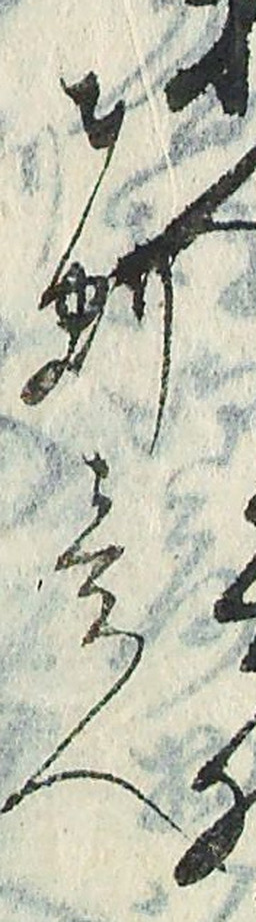才判壱人
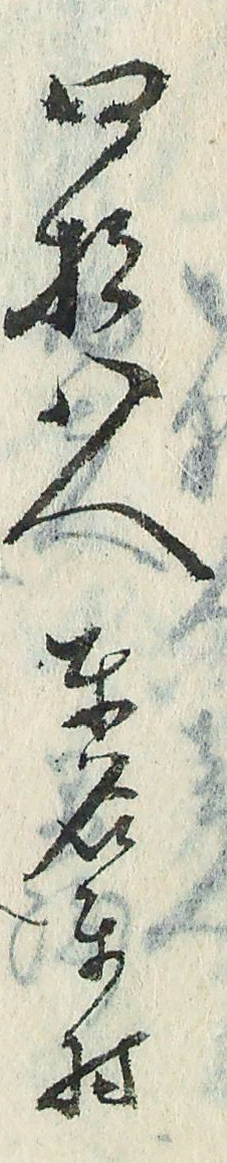同拾八人東名東村
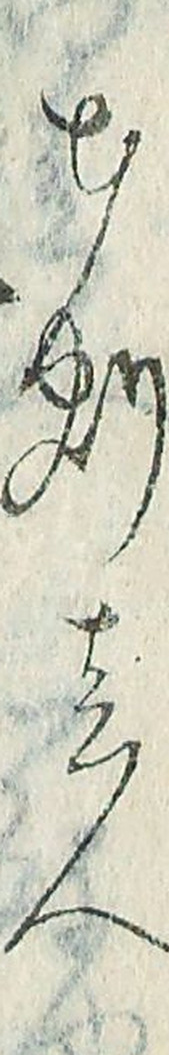才判壱人
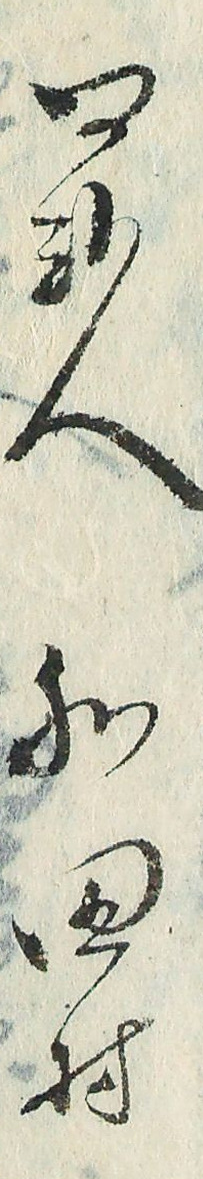同弐人和田村
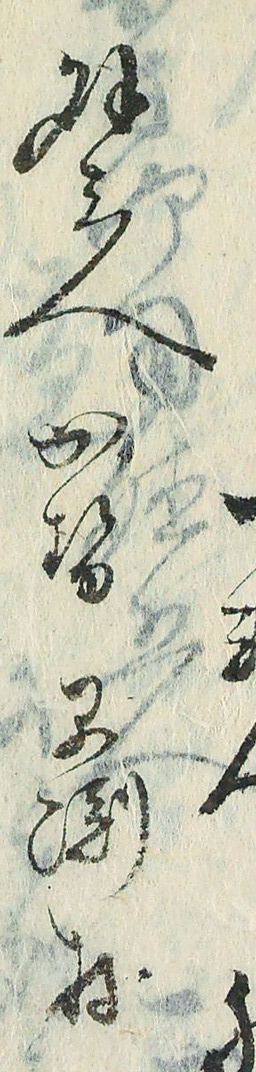外三人加勢早淵村
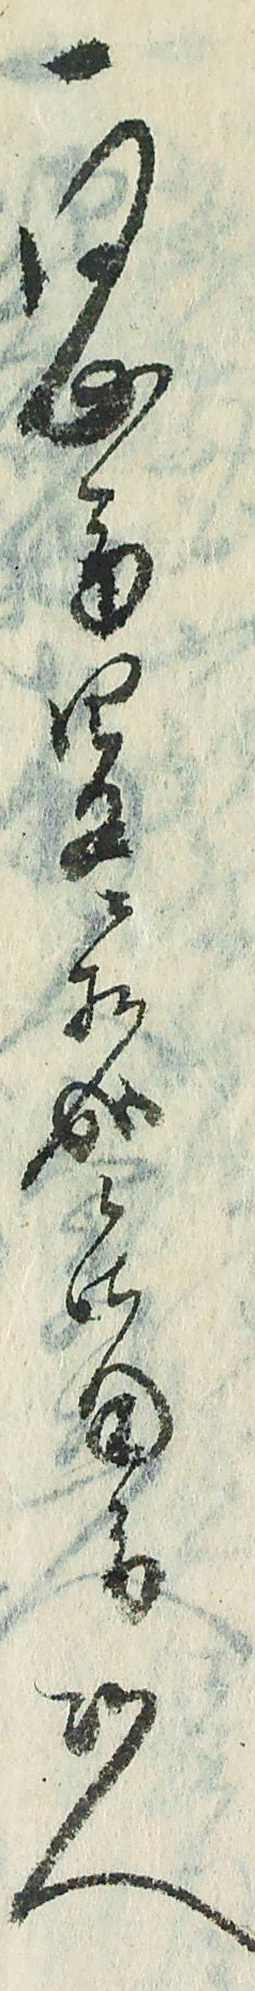一同心方四手に相成候御用方弐人
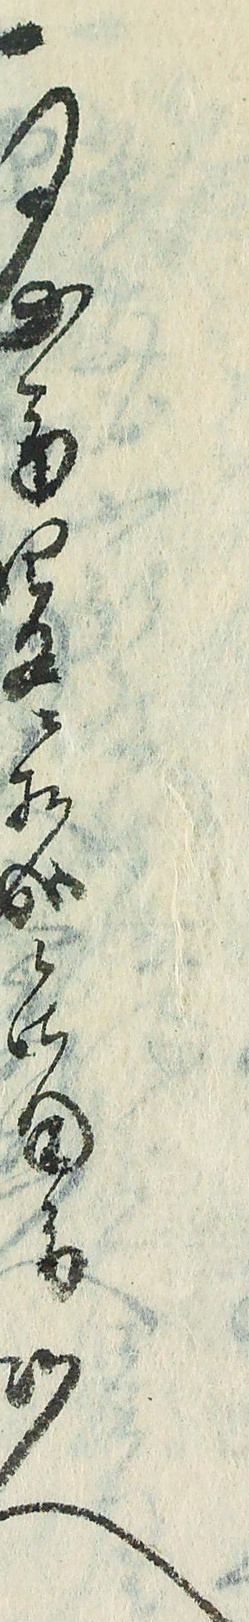一同心方四手に相成候御用方弐人
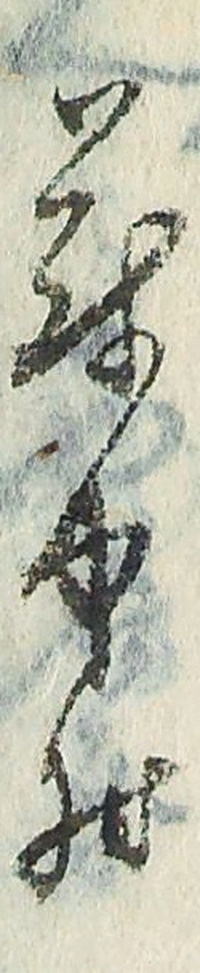府中村
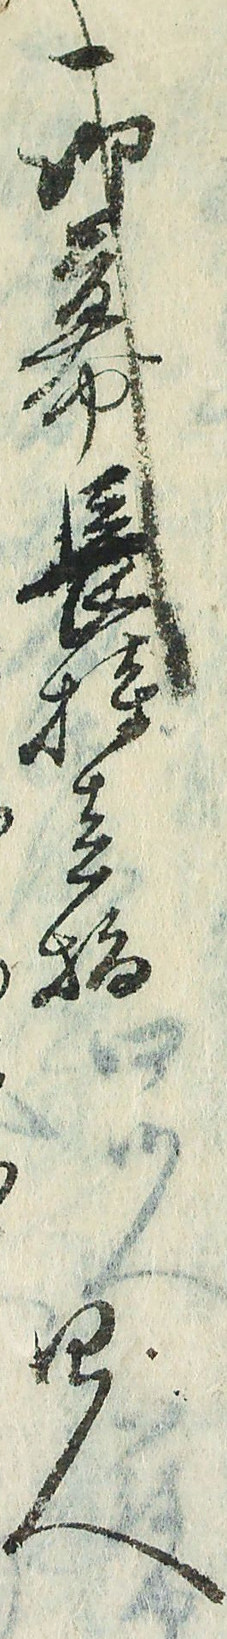一御幕長持壱指四人
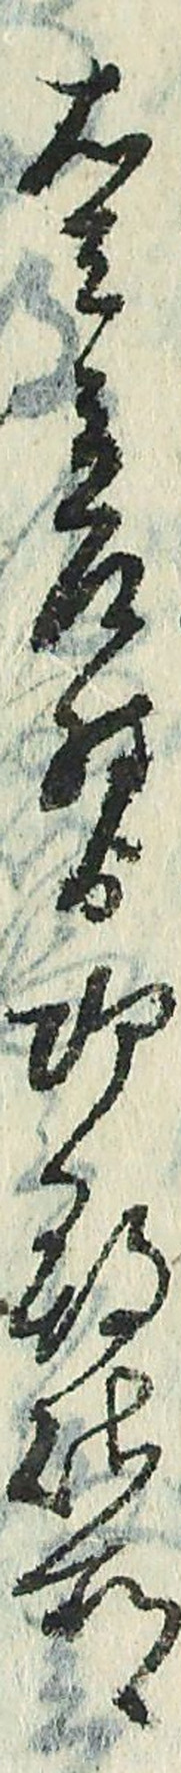右は立江村ゟ御郡代所へ
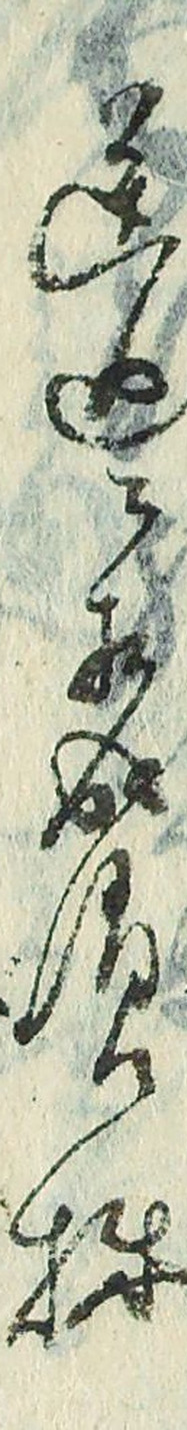送込に相成居候株
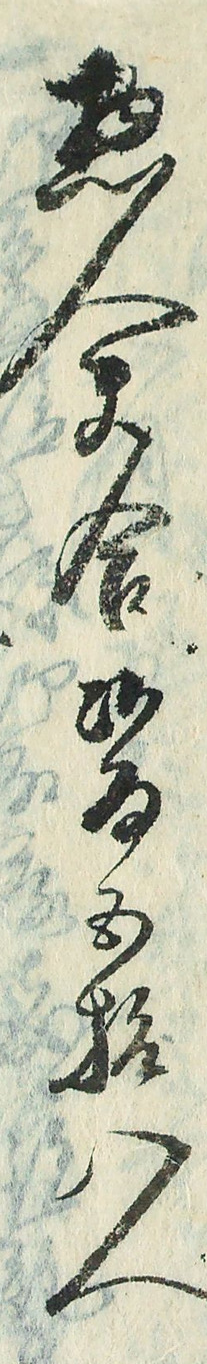惣人夫合弐百五拾八人
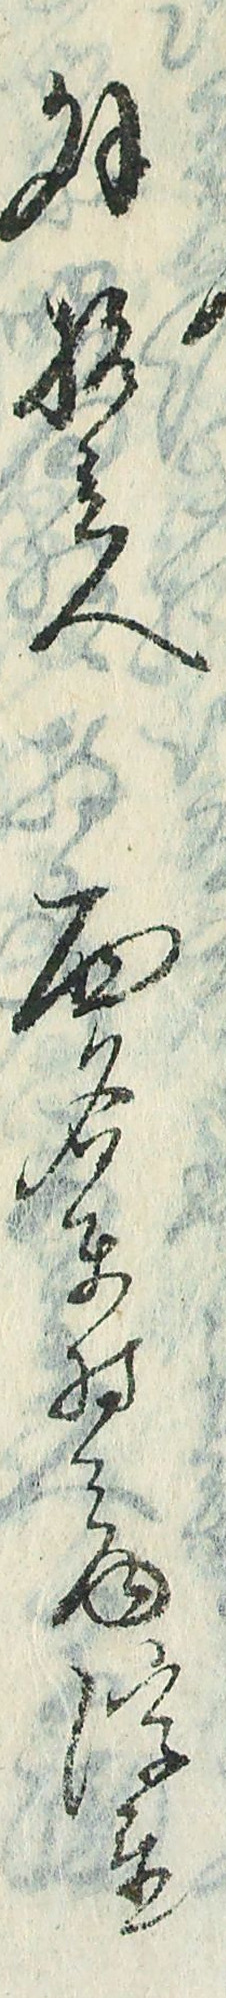外拾壱人西名東村之内浮置
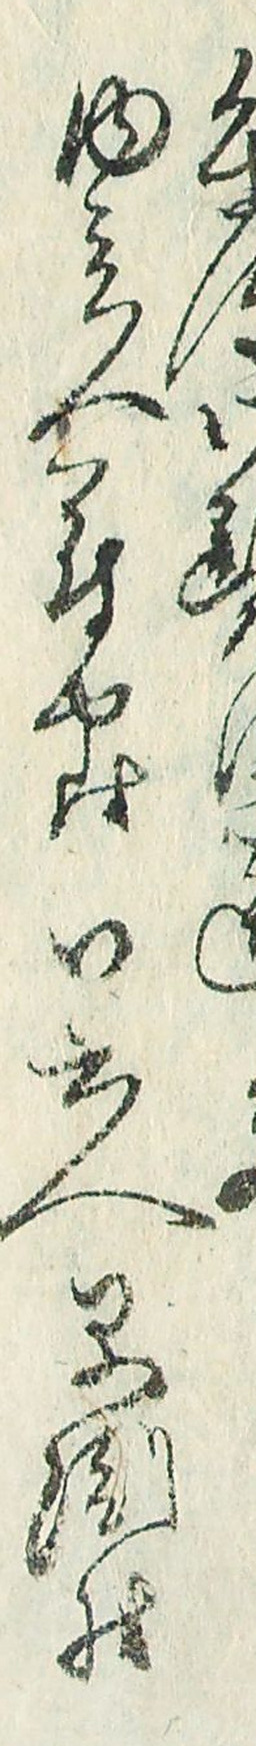内壱人府中村同六人早淵村

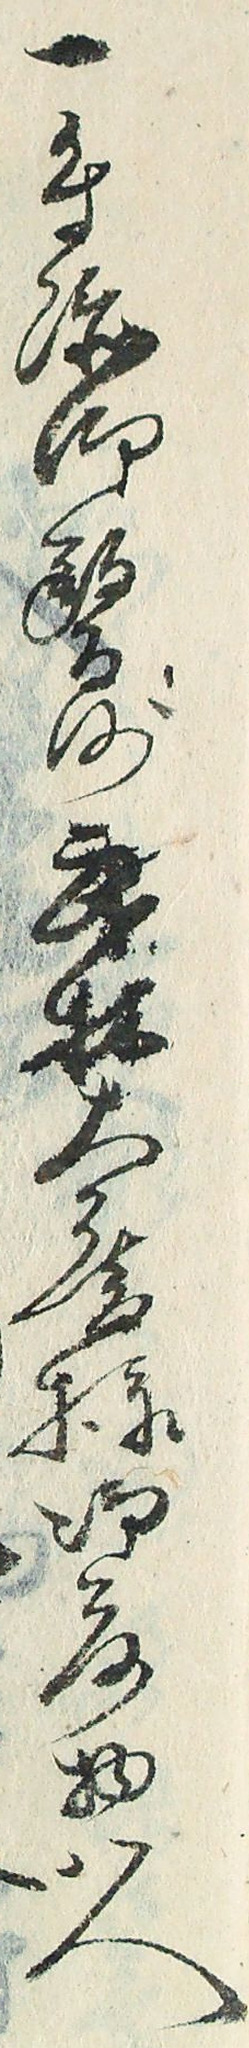一付添御医師武林大庵様御荷物八人
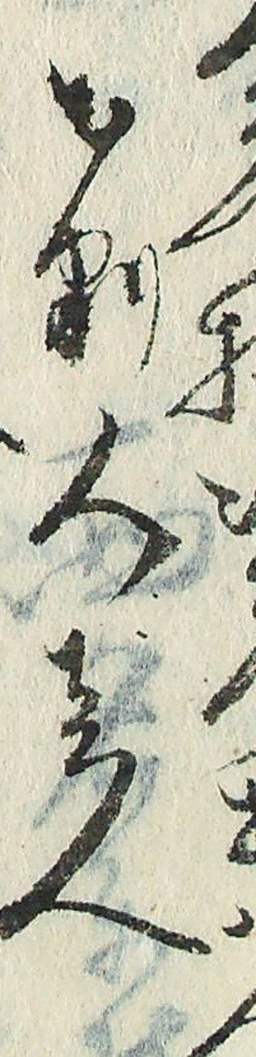才判人壱人
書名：公辺御役人為御廻浦御立越諸御用一巻
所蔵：鳴門教育大学 Naruto University of Education
